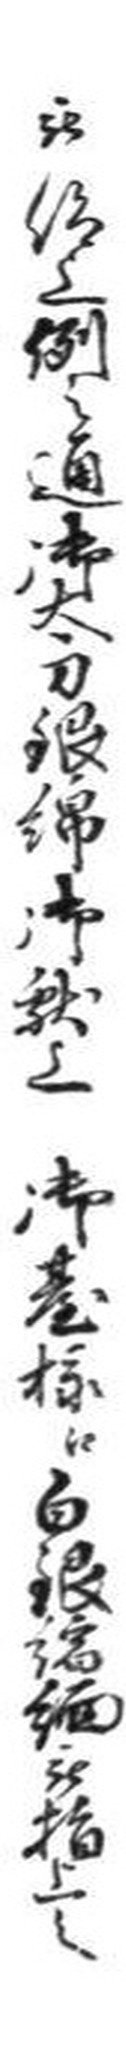被仰上例之通御太刀銀綿御献上御台様江白銀縮緬被指上之
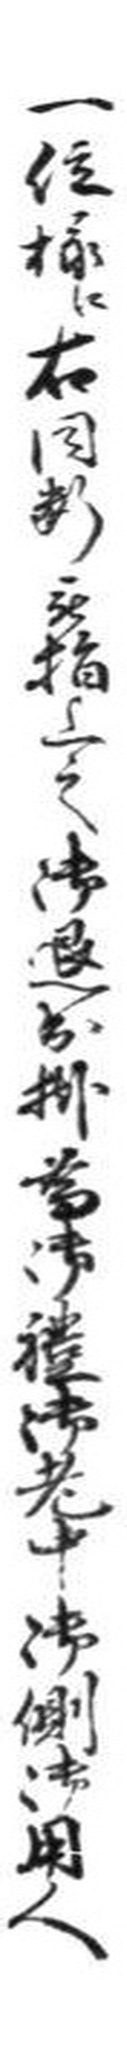一位様江右同断被指上之御退出掛為御礼御老中御側御用人
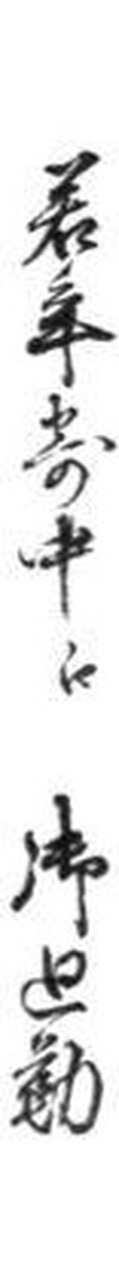若年寄中江御廻勤
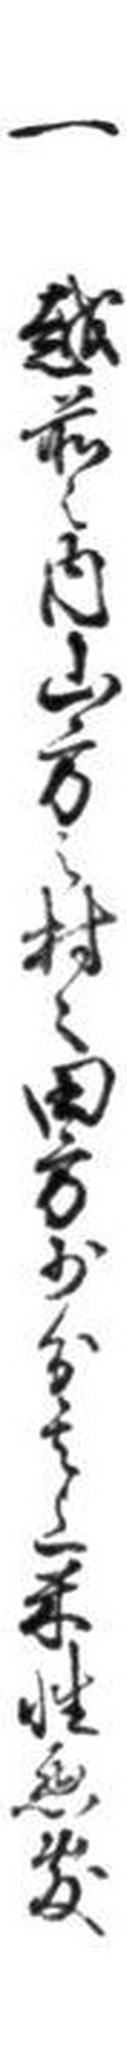一越前之内山方之村々田方少分其上米性悪敷
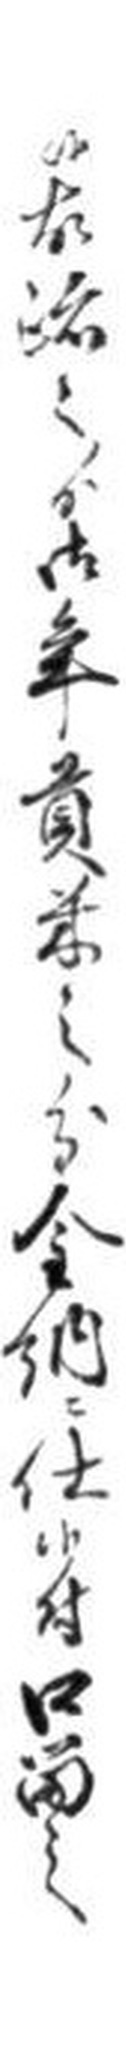候故跡々ゟ御年貢米之分金納ニ仕候付口留之
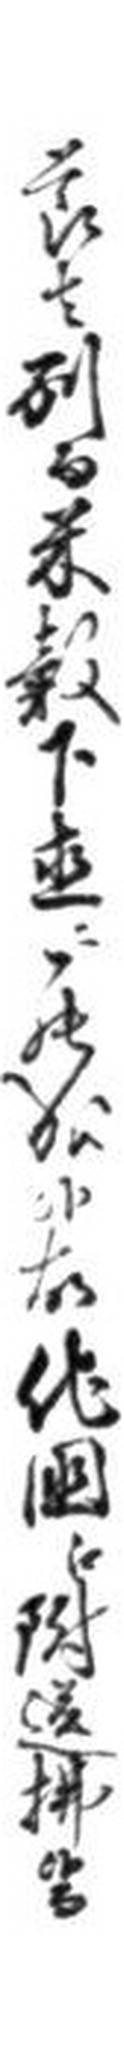節者別而米穀下直ニ罷成候故他国江付送払候而
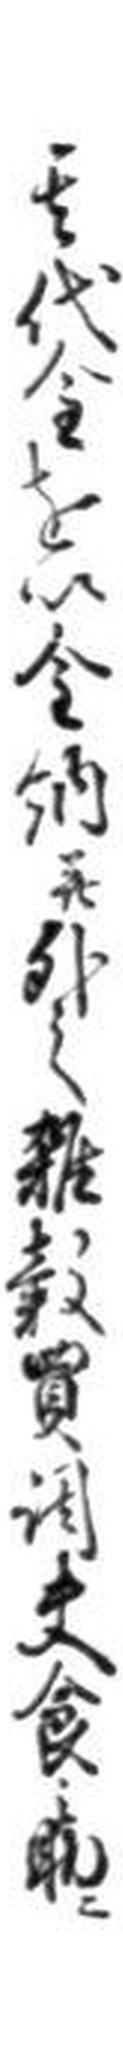其代金を以金納并外之雑穀買調夫食之助ニ
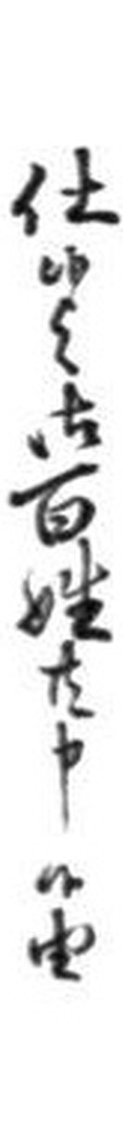仕候与御百姓共申候由
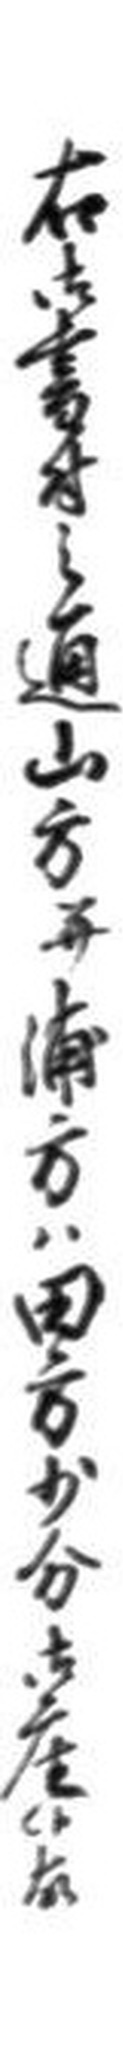右御書付之通山方并浦方ハ田方少分御座候故
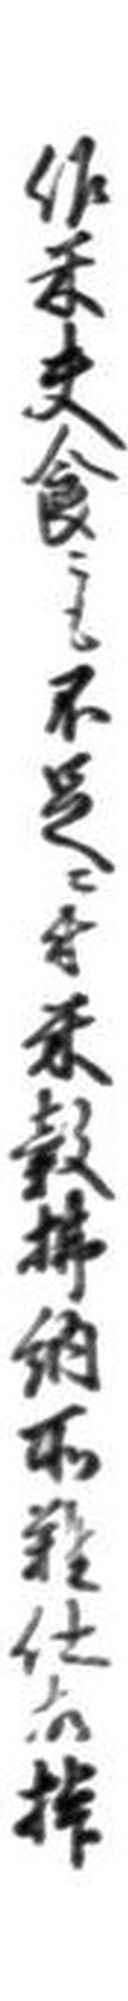作米夫食ニも不足ニ付米穀払納所難仕故挊
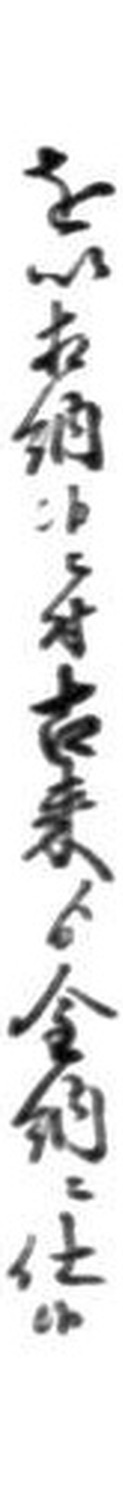を以相納候ニ付古来ゟ金納ニ仕候
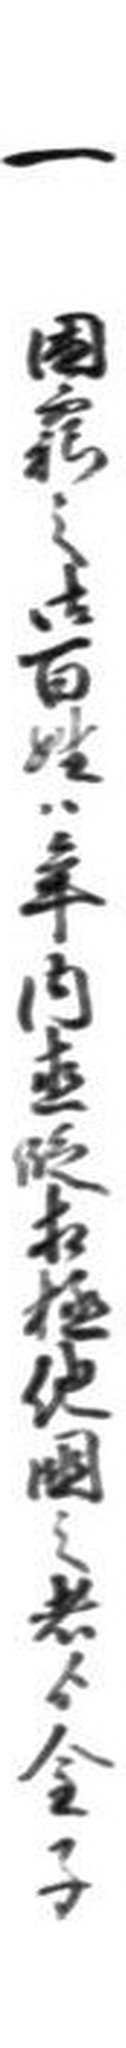一困窮之御百姓ハ年内直段相極他国之者ゟ金子
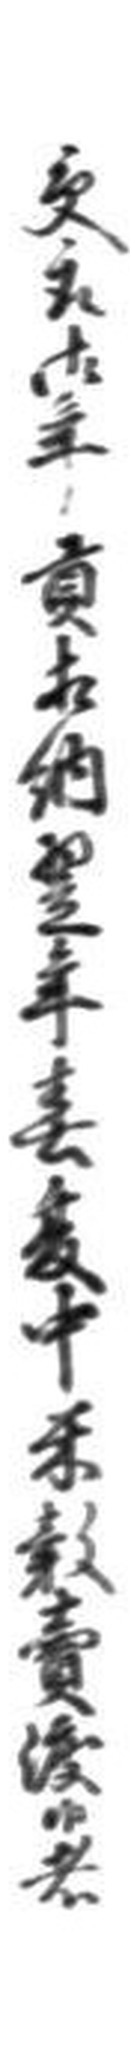受取御年貢相納翌年春夏中米穀売渡候者
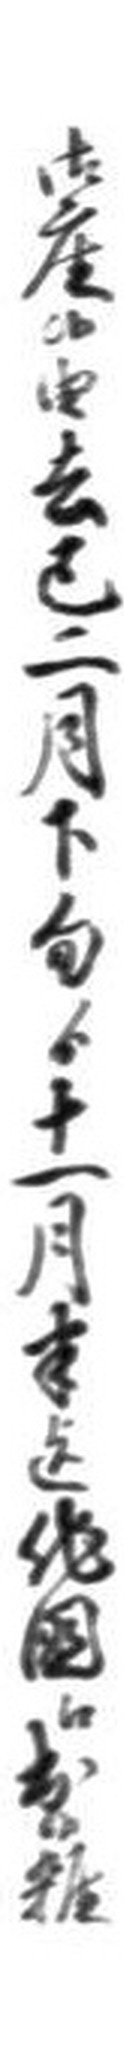御座候由去巳二月下旬ゟ十一月半迄他国江出候雑
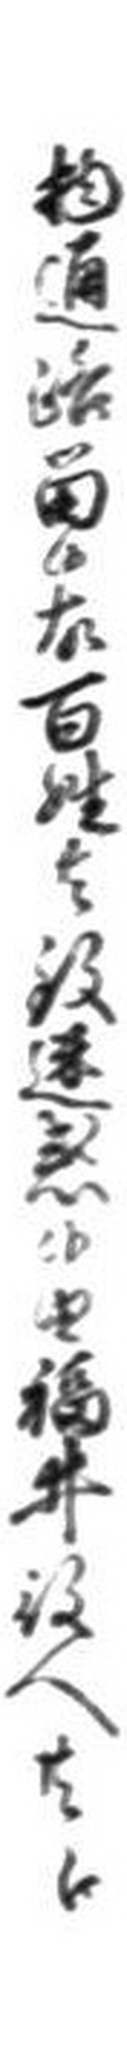物通路留候故百姓共致迷惑候由福井役人共江
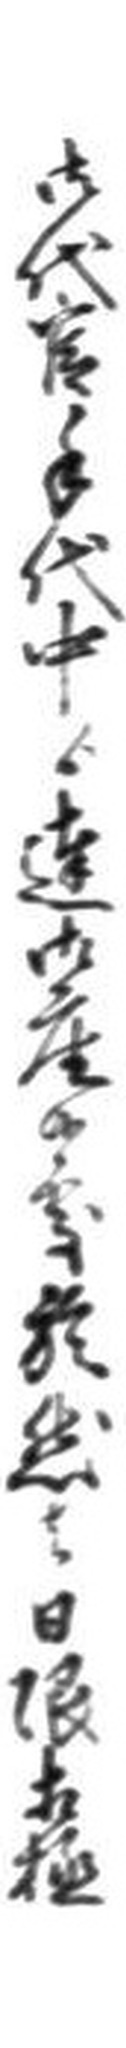御代官手代中ゟ達御座候処於然者日限相極
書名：家譜 二十二 吉品公 従元禄十五年到同十六年
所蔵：福井県文書館 Fukui Prefectural Archives
